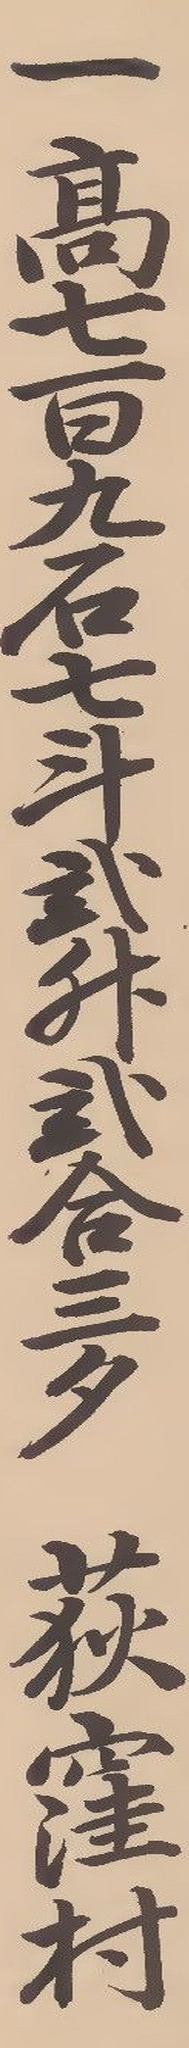一高七百九石七斗弐升弐合三勺荻窪村
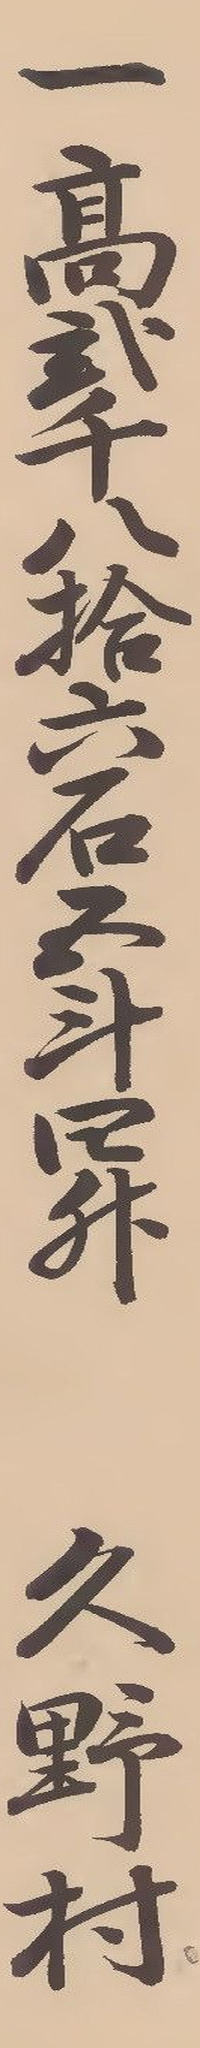一高弐千八拾六石五斗四升久野村
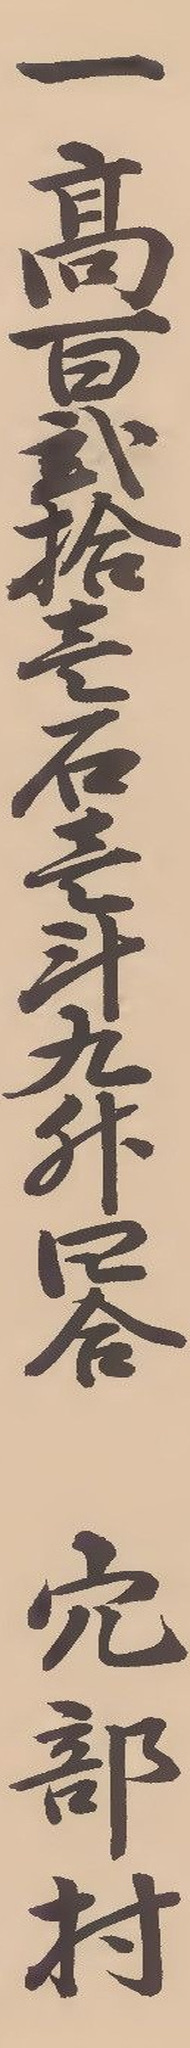一高百弐拾壱石壱斗九升四合穴部村
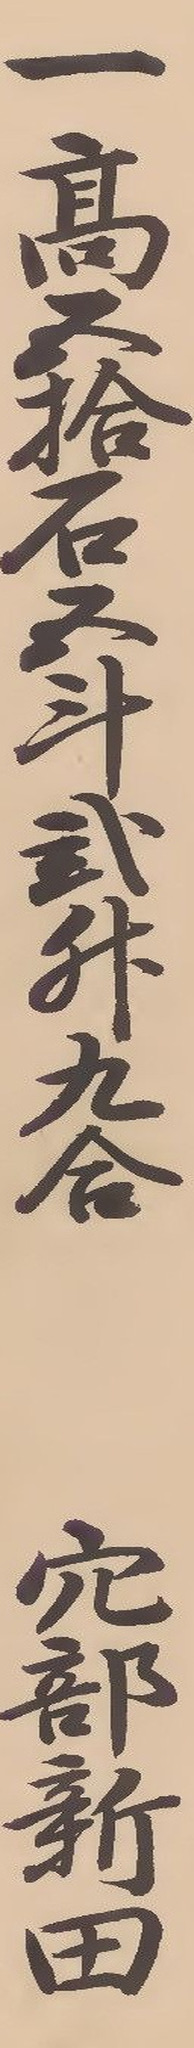一高五拾石五斗弐升九合穴部新田

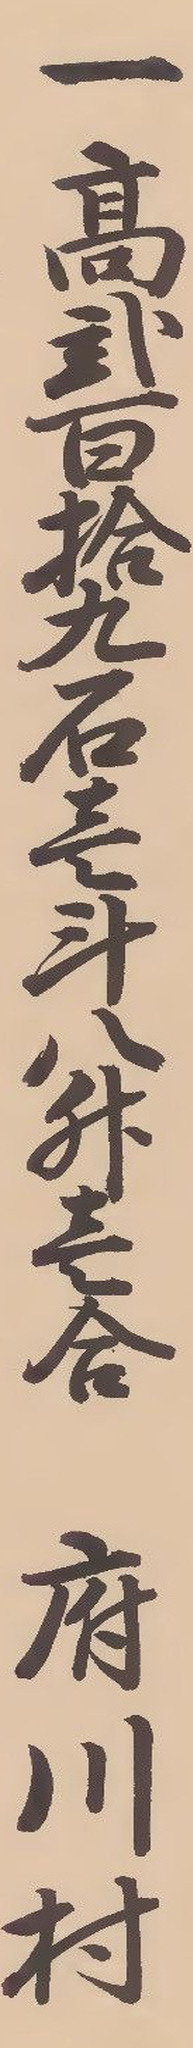一高弐百拾九石壱斗八升壱合府川村
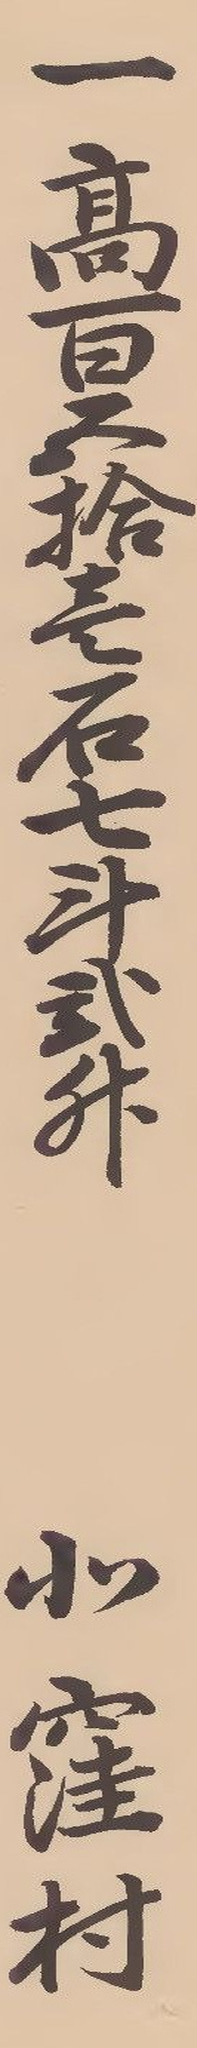一高百五拾壱石七斗弐升北窪村
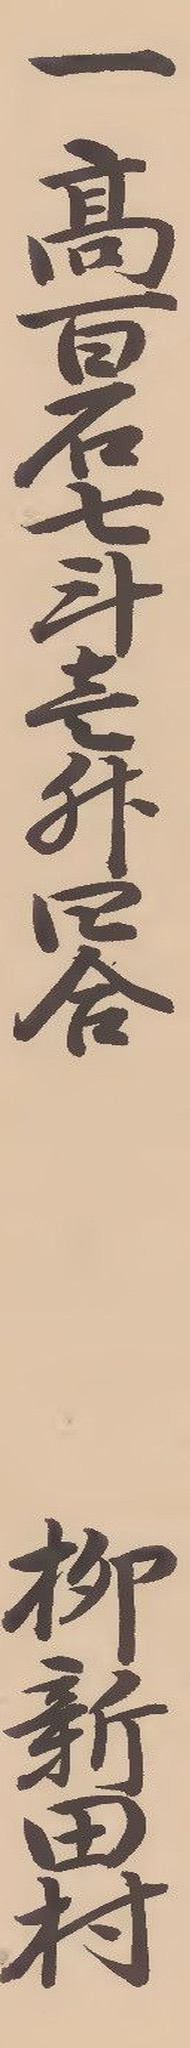一高百石七斗壱升四合柳新田村
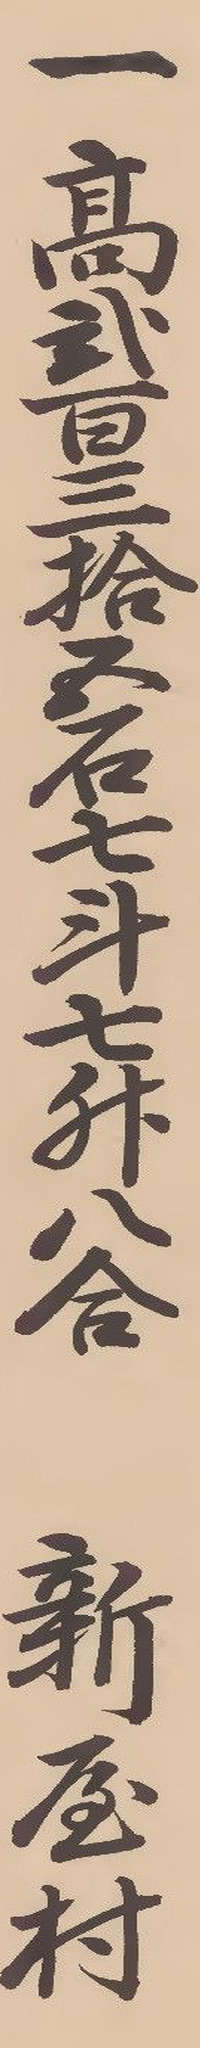一高弐百三拾五石七斗七升八合新屋村
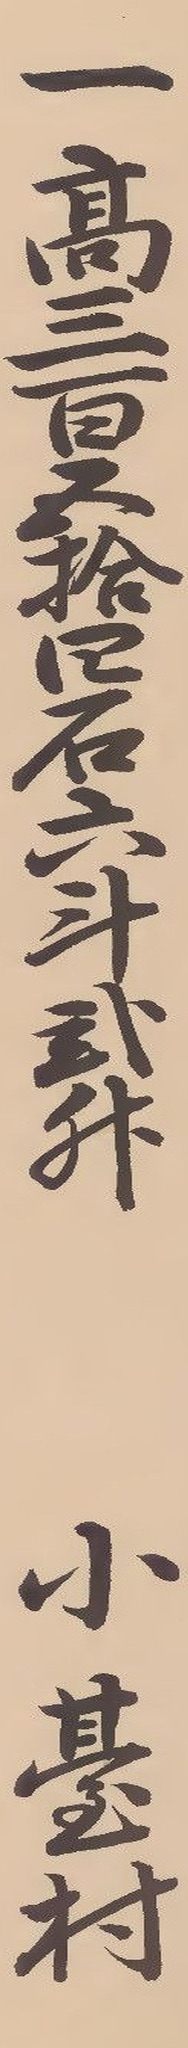一高三百五拾四石六斗弐升小台村
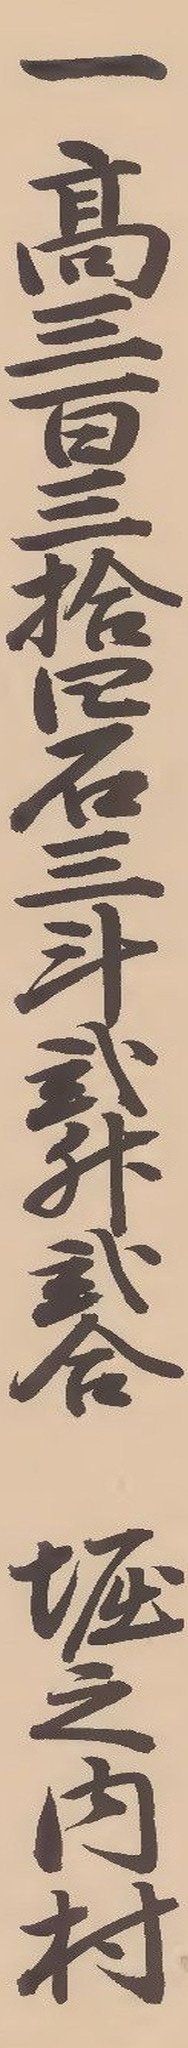一高三百三拾四石三斗弐升弐合堀之内村
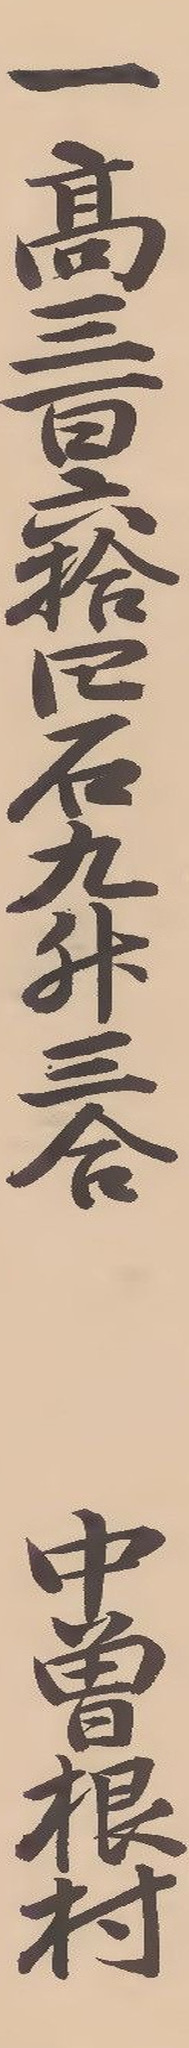一高三百六拾四石九升三合中曽根村
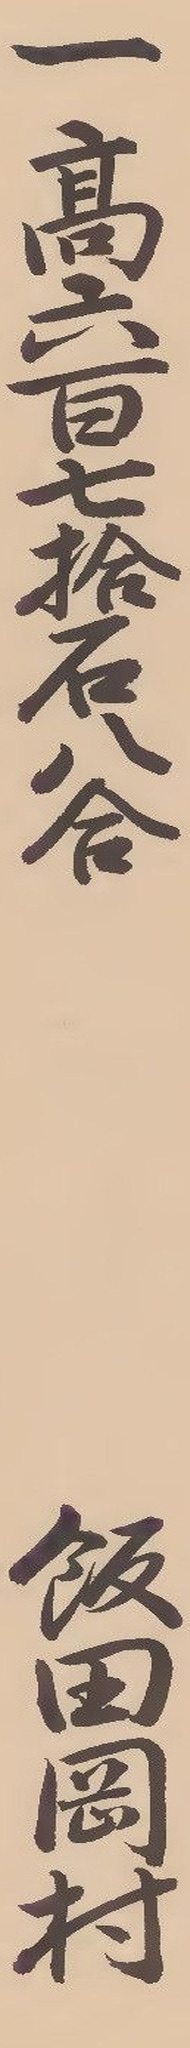一高六百七拾石八合飯田岡村

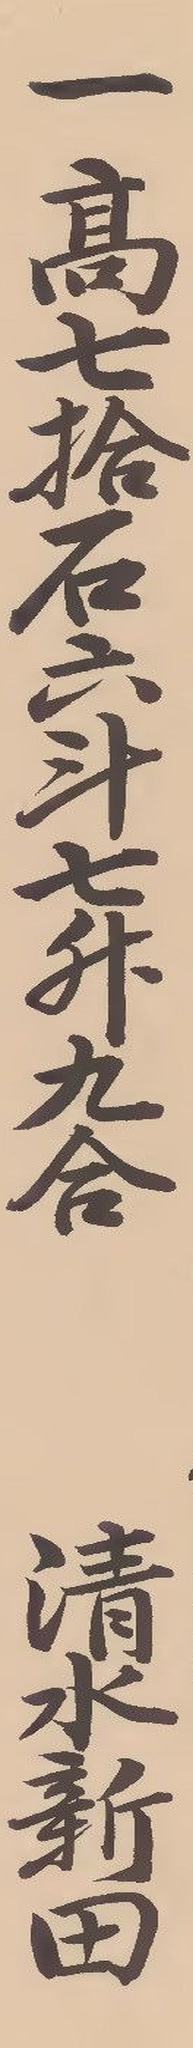一高七拾石六斗七升九合清水新田
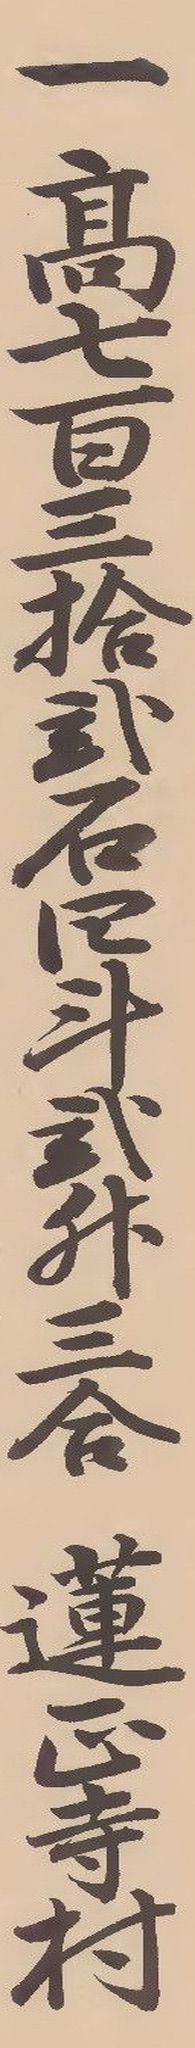一高七百三拾弐石四斗弐升三合蓮正寺村
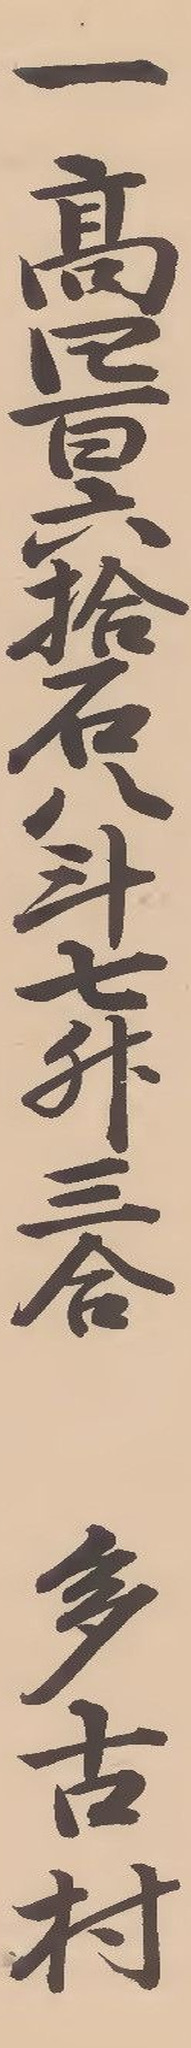一高四百六拾石八斗七升三合多古村
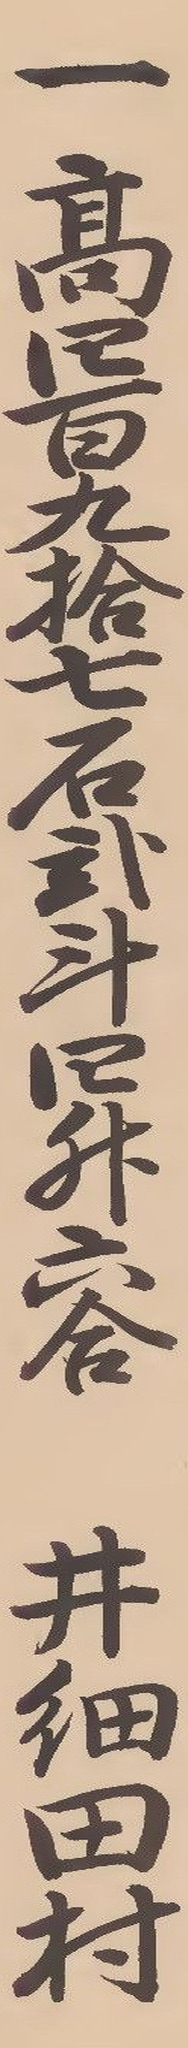一高四百九拾七石弐斗四升六合井細田村
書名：相模国郷帳
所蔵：国立公文書館 National Archives of Japan
